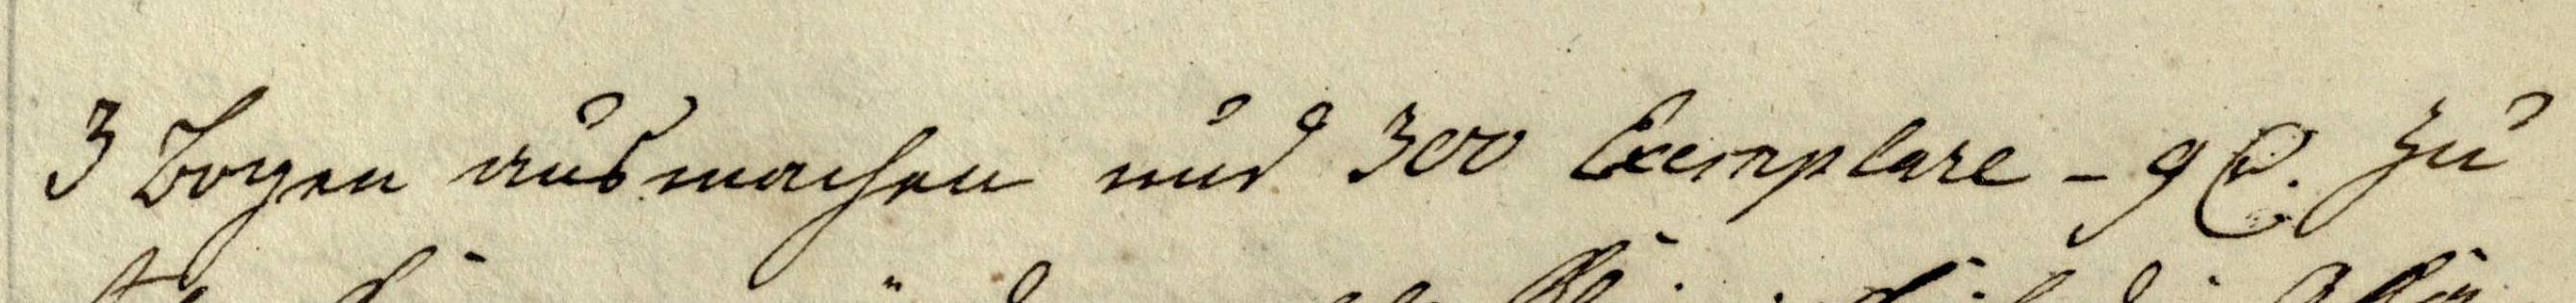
3 Bogen ausmachen und 300 Exemplare - 9 l. zu
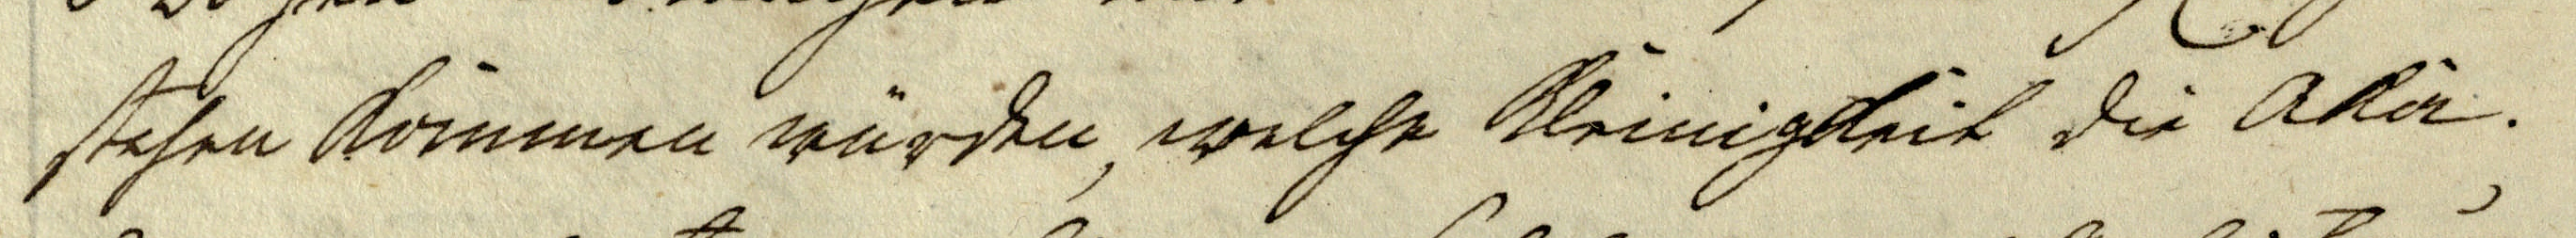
stehen kommen würden, welche Kleinigkeit die Aka¬
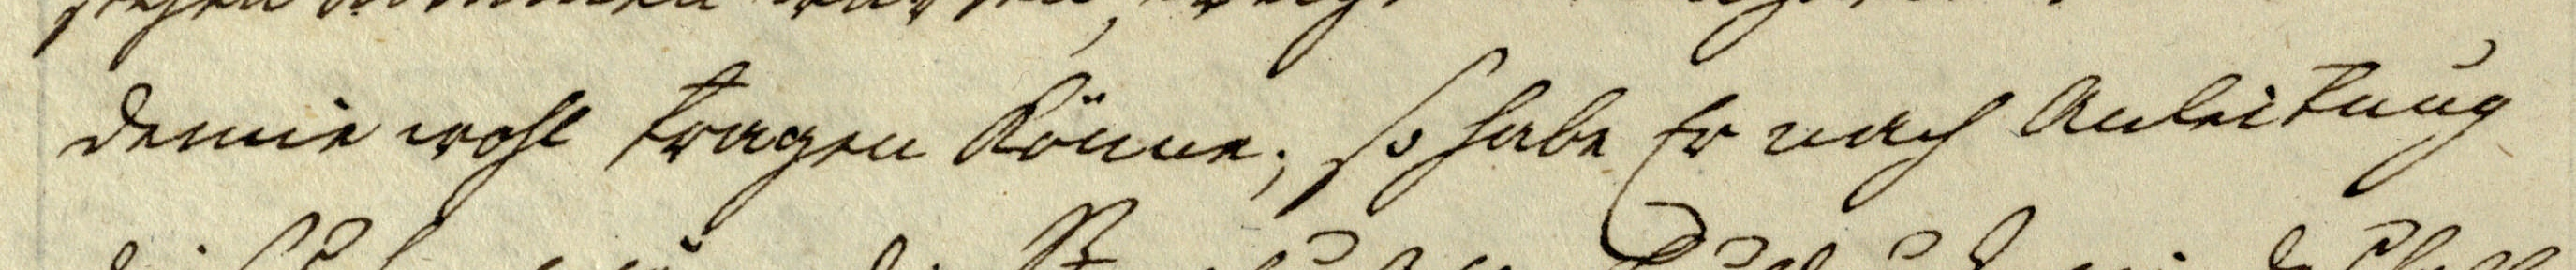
demie wohl tragen könne; so habe Er nach Anleitung
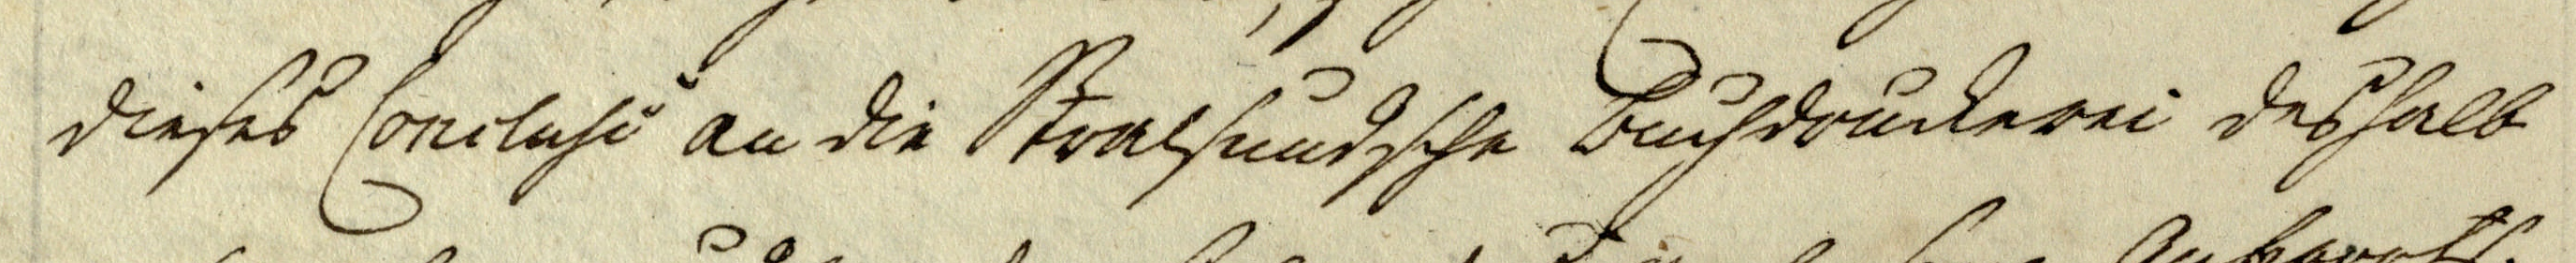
dieses Conclusi an die Stralsundsche Buchdruckerei deshalb
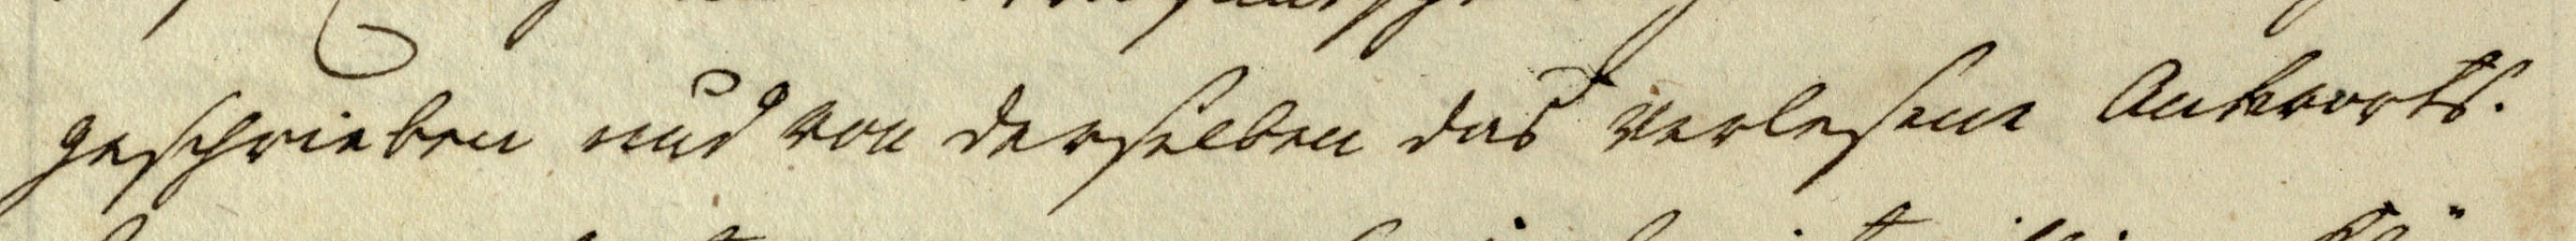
geschrieben und von derselben das verlesene Antworts¬
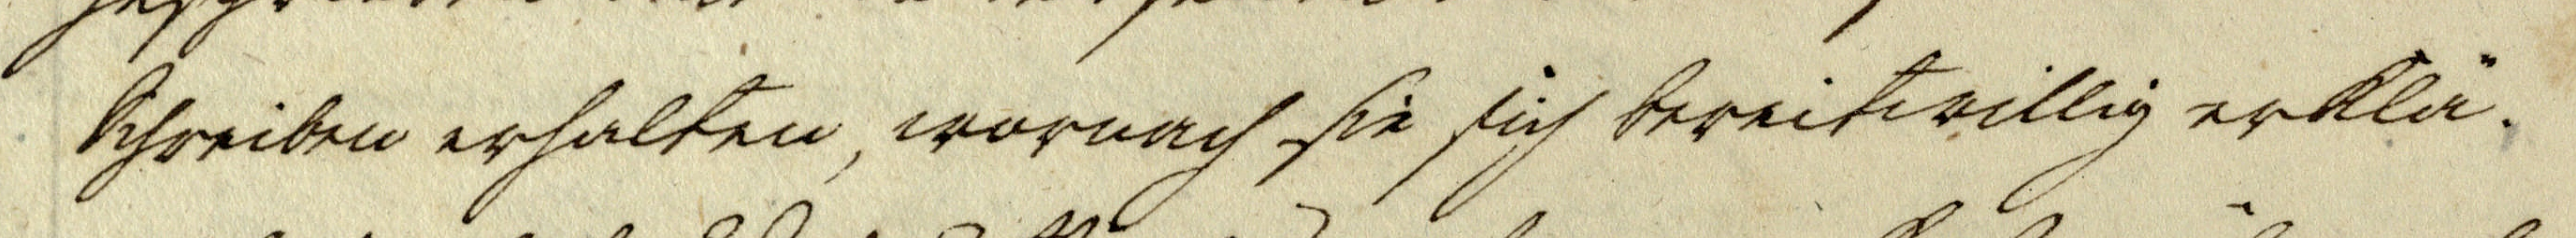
Schreiben erhalten, wornach sie sich bereitwillig erklä¬
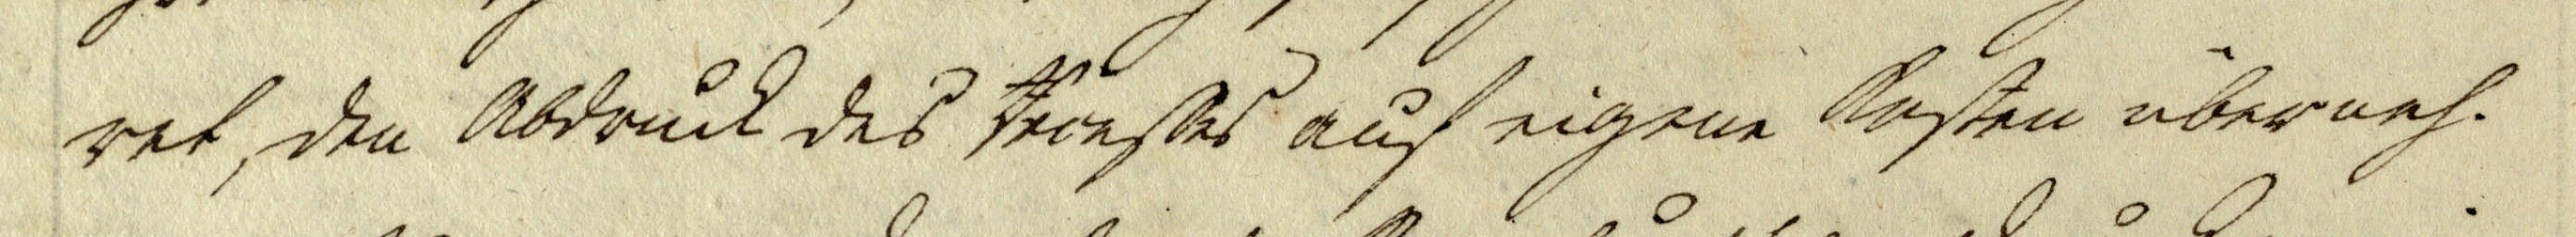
ret, den Abdruck des Recesses auf eigene Kosten überneh¬
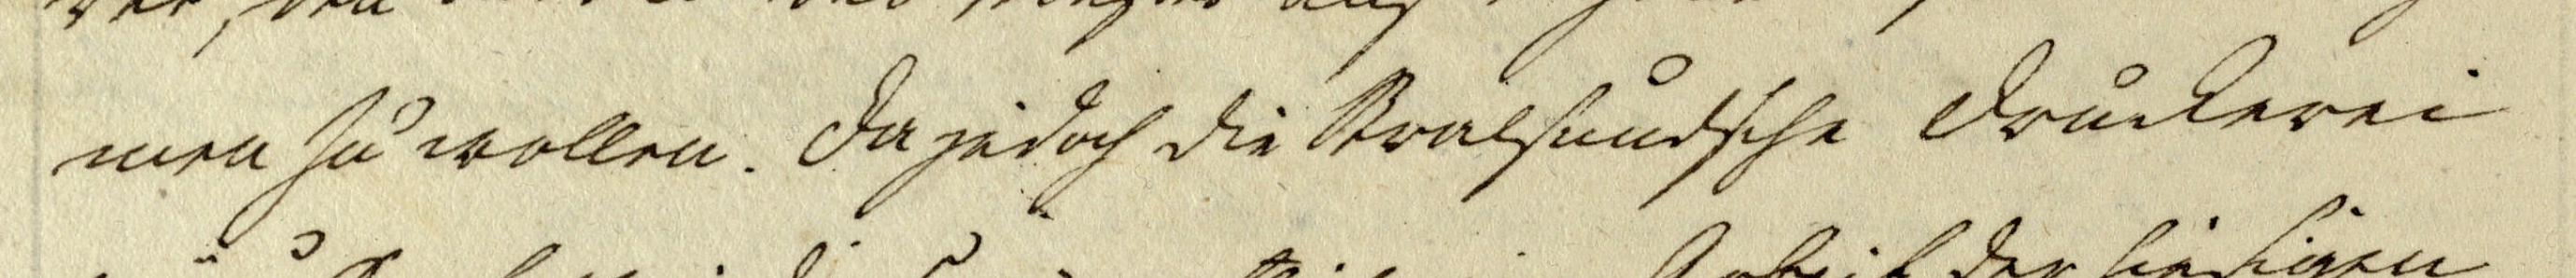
men zu wollen. Da jedoch die Stralsundsche Druckerei
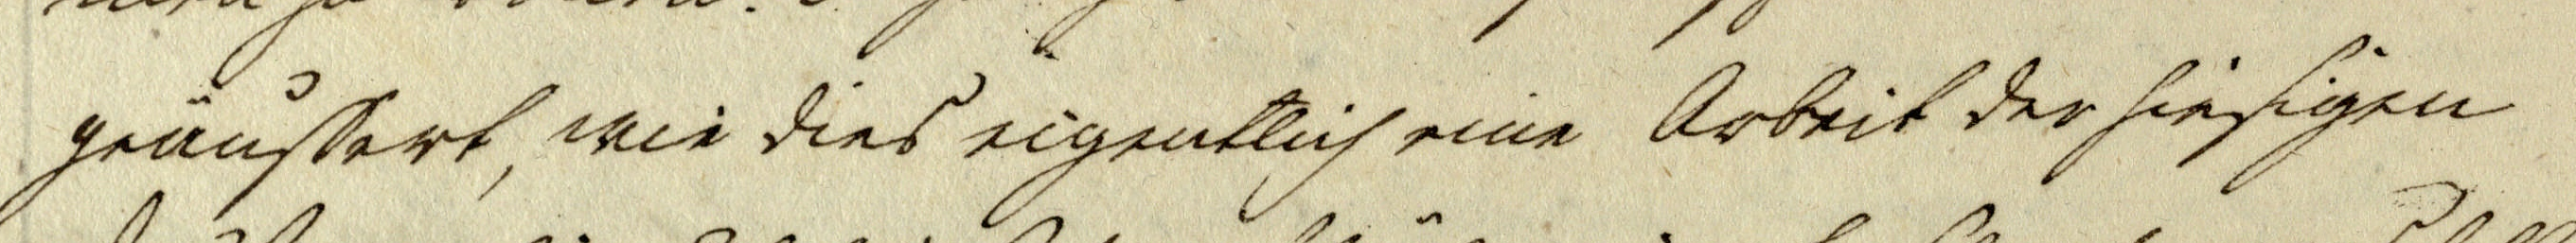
geäussert, wie dies eigentlich eine Arbeit der hiesigen
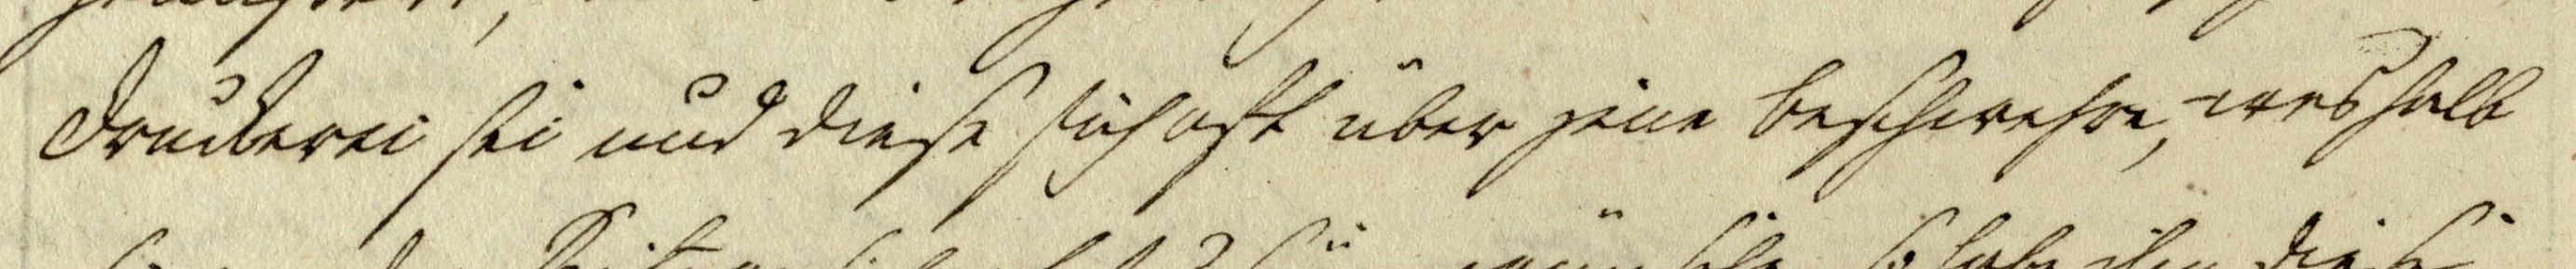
Drudkerei sei und diese sich oft über jene beschwehre, weshalb
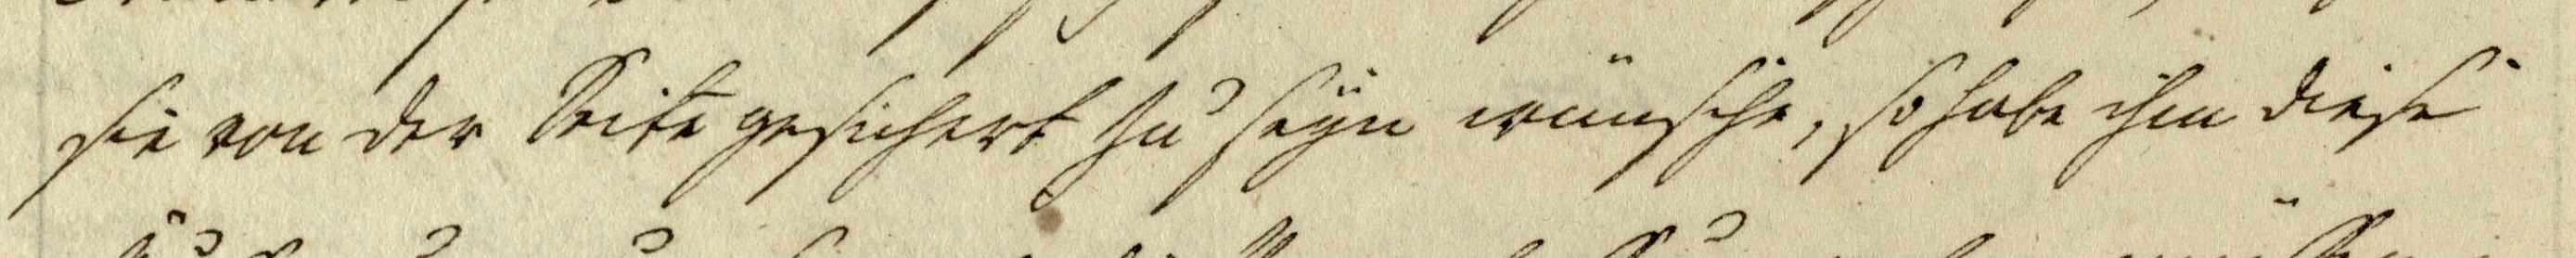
sie von der Seite gesichert zu seÿn wünsche, so habe ihm diese
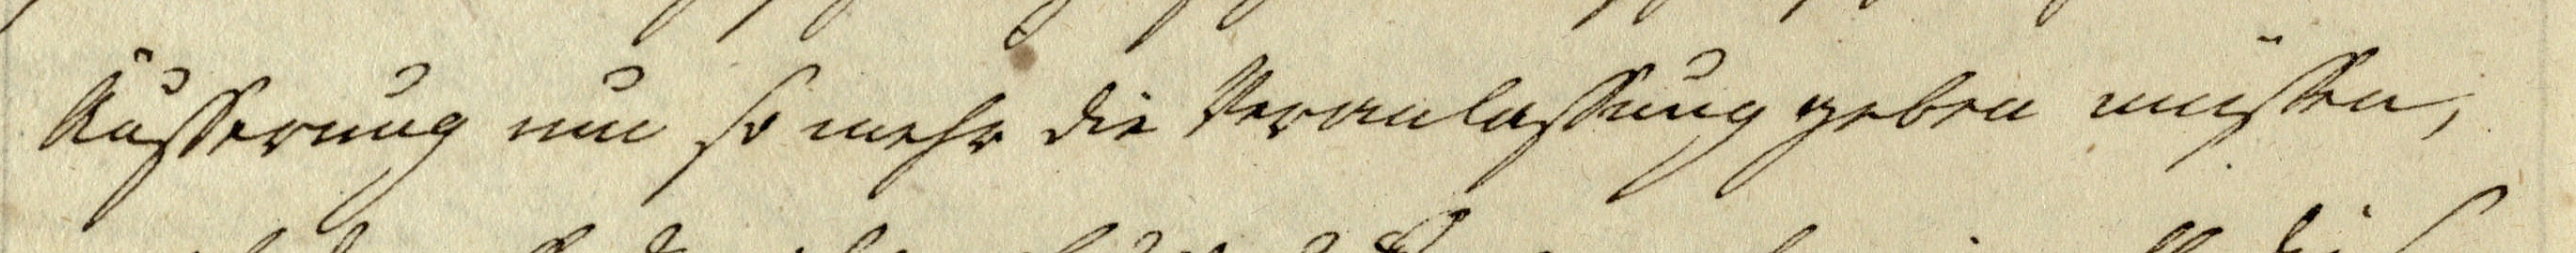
Äusserung um so mehr die Veranlassung geben müssen,
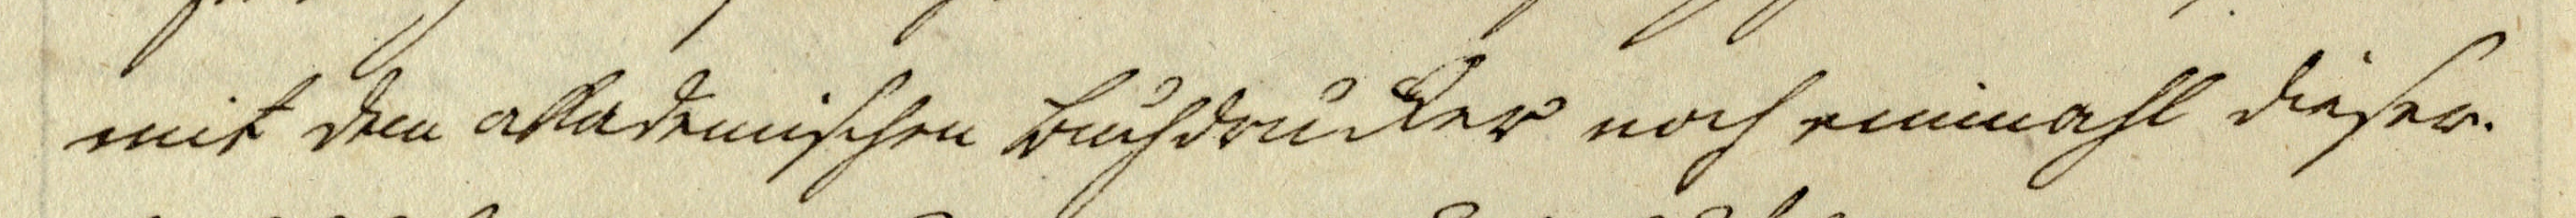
mit dem akademischen Buchdrucker noch einmahl dieser¬
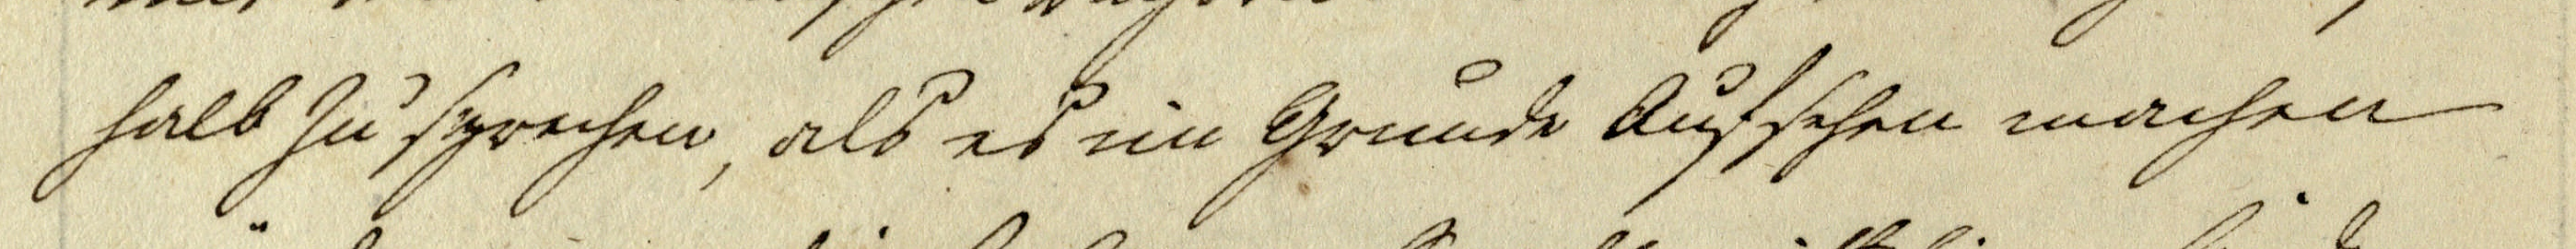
halb zu sprechen, als es im Grunde Aufsehen machen
